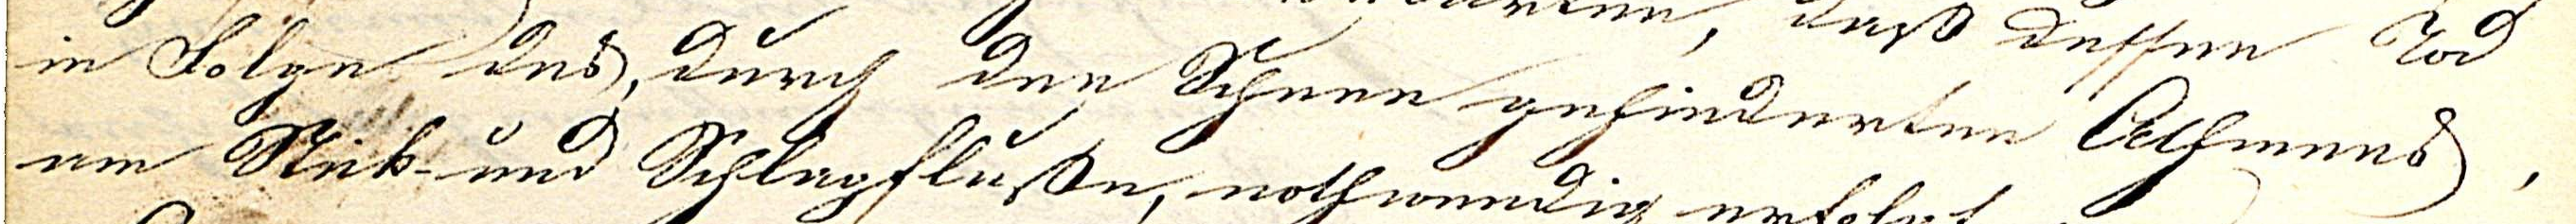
in Folge des, durch den Schnee gehinderten Athmens,
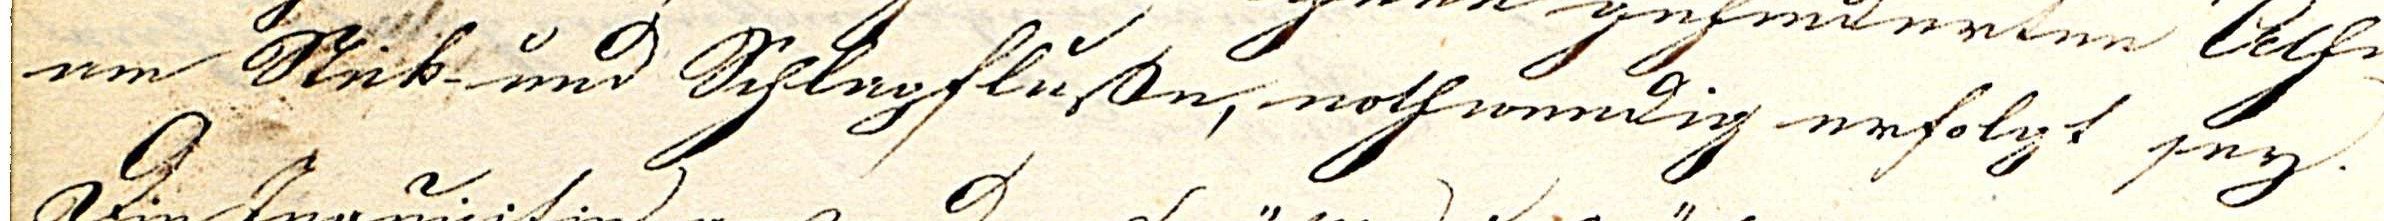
am Stick und Schlagfluße, nothwendig erfolgt sey.
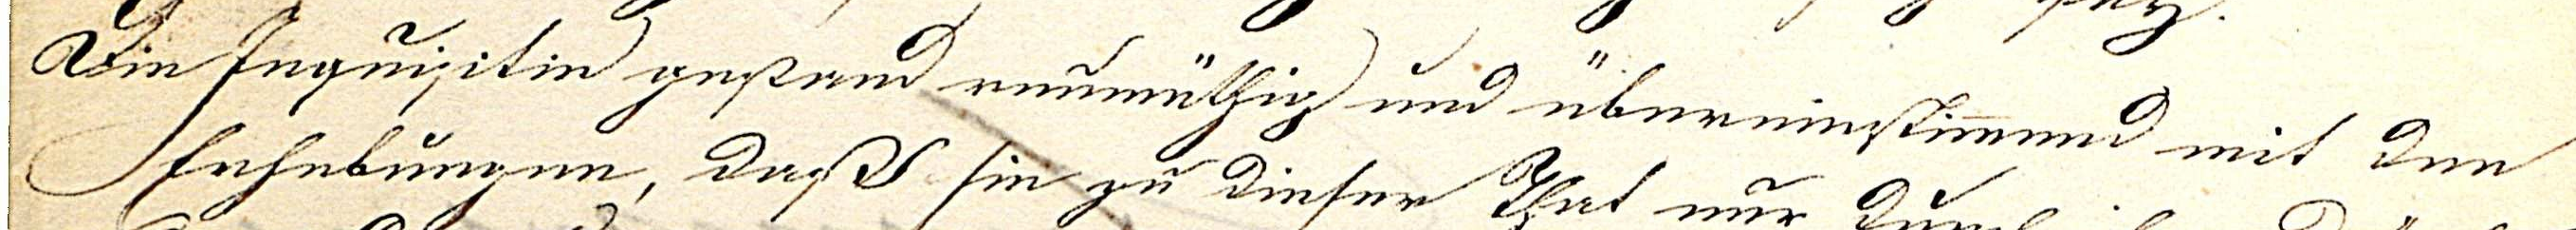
Die Inquisitin gestand reumüthig und übereinstimmend mit den
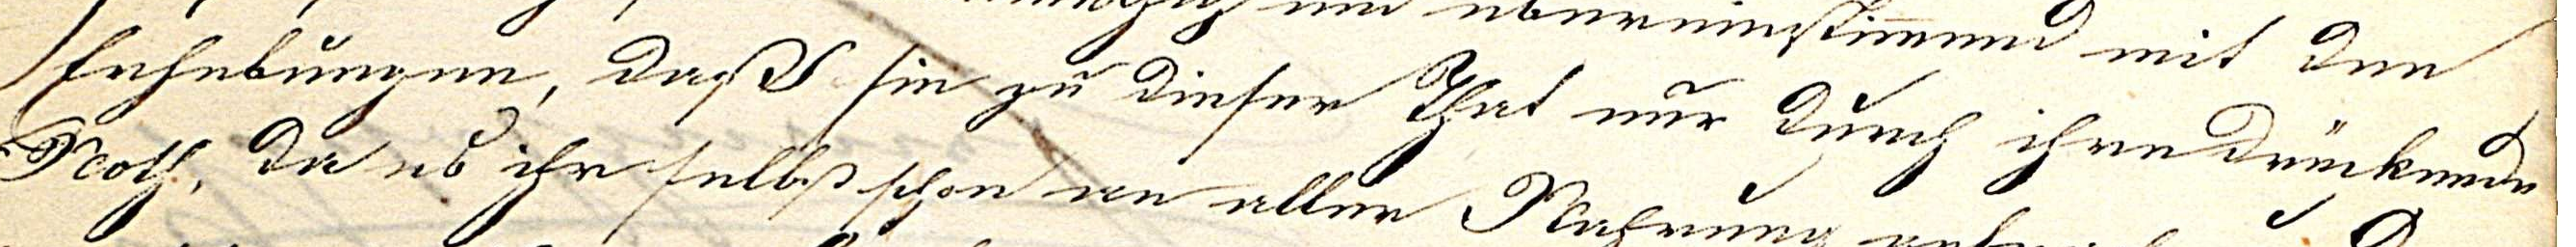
Erhebungen, daß sie zu dieser That nur durch ihre drückende
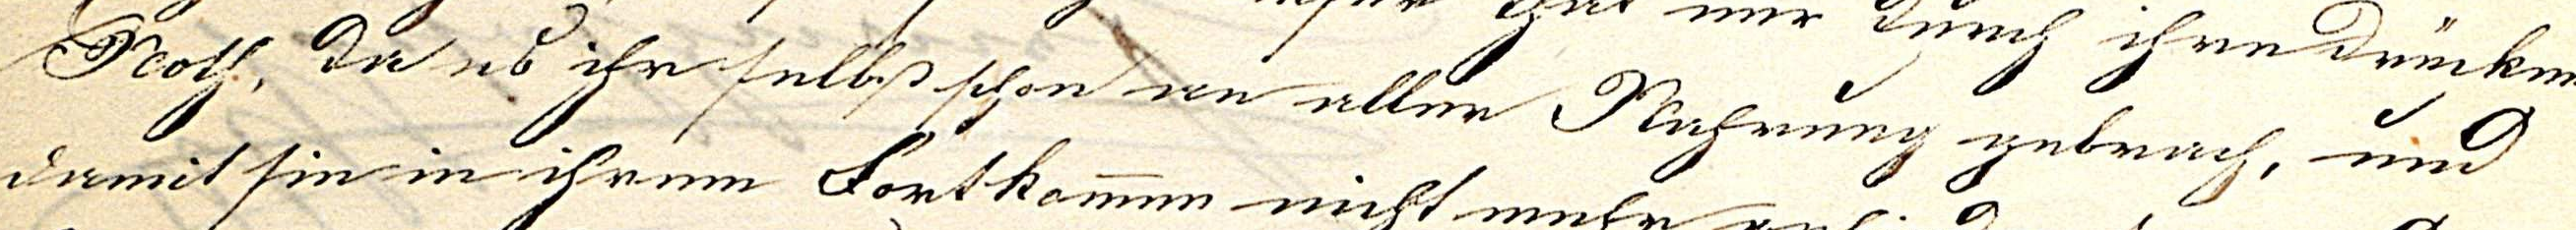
Noth, da es ihr selbst schon an aller Nahrung gebrach, und
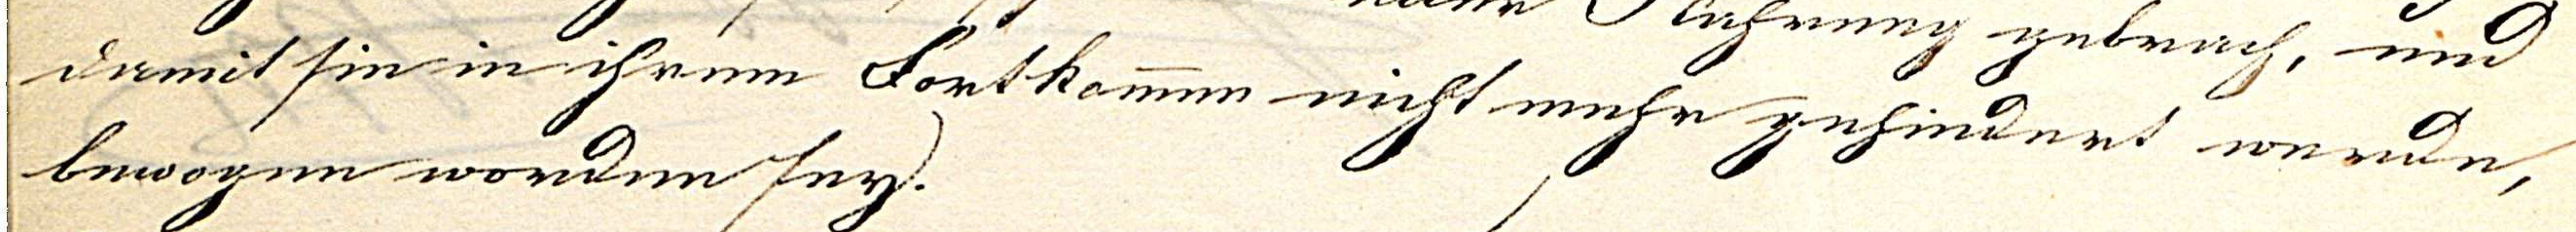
damit sie in ihrem Fortkommen nicht mehr gehindert werde,
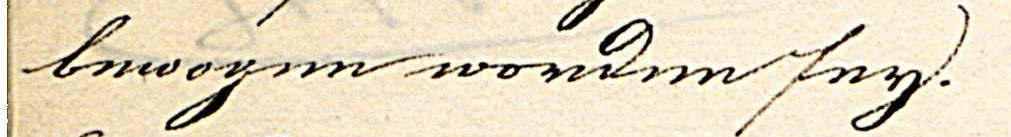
bewogen worden sey.
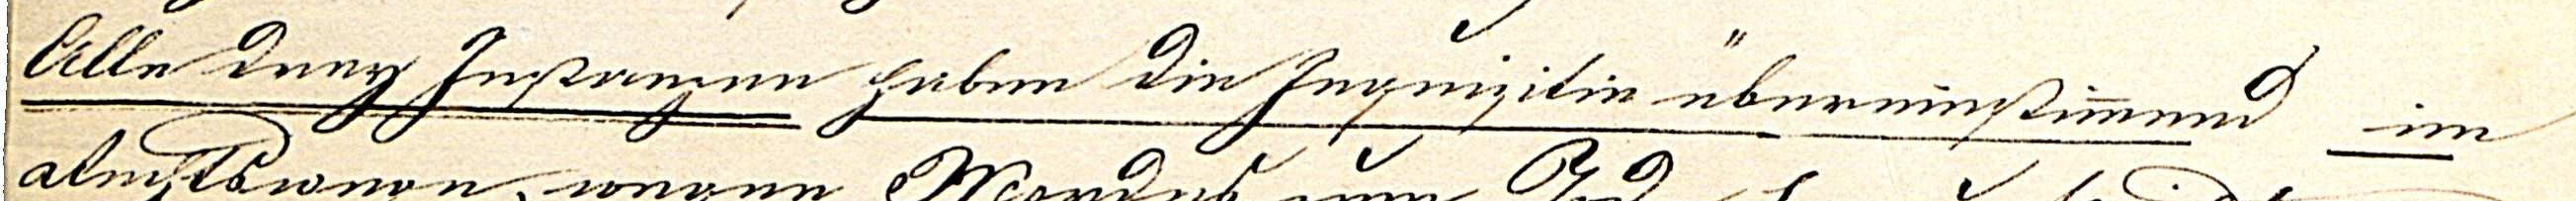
Alle drey Instanzen haben die Inquisitin übereinstimmend im
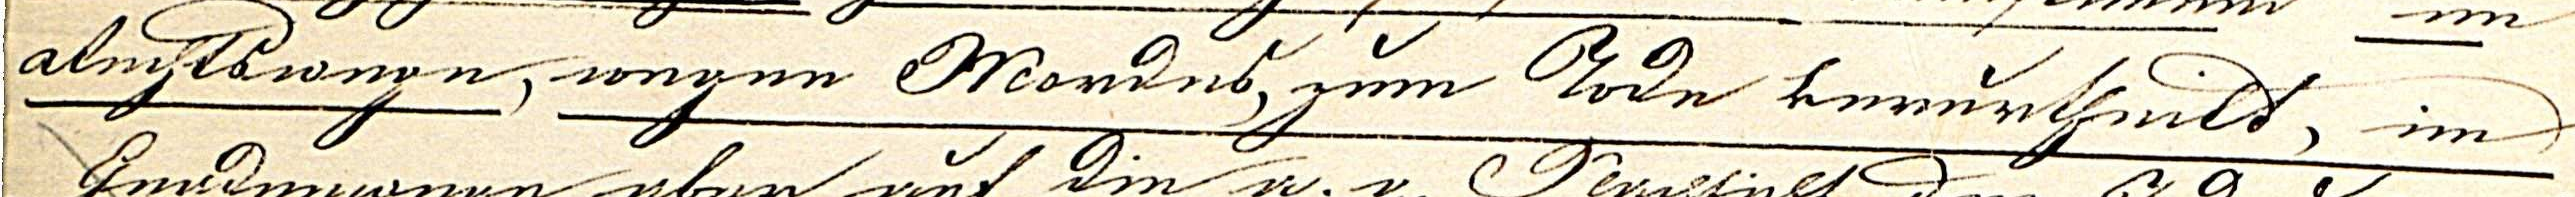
Rechtswege, wegen Mordes, zum Tode verurtheilt, im
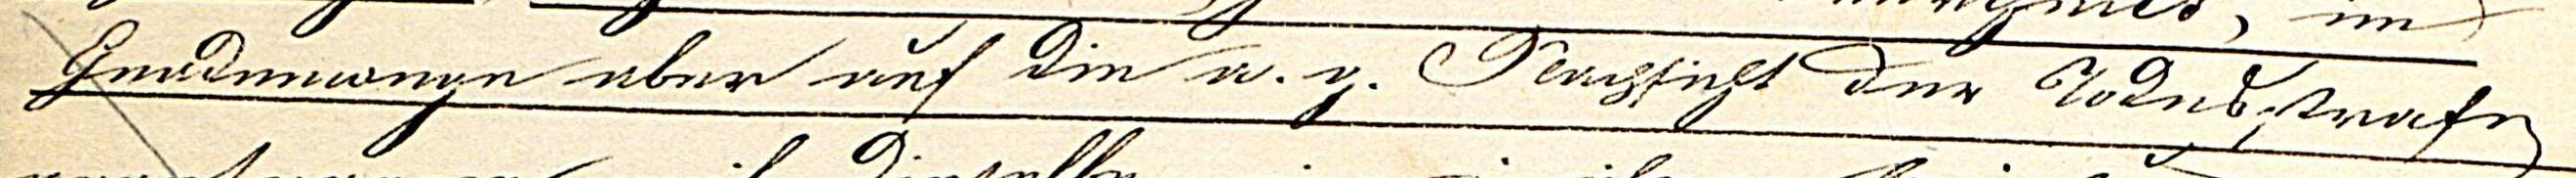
Gnadenweges aber auf die a.g. Nachsicht der Todesstrafe
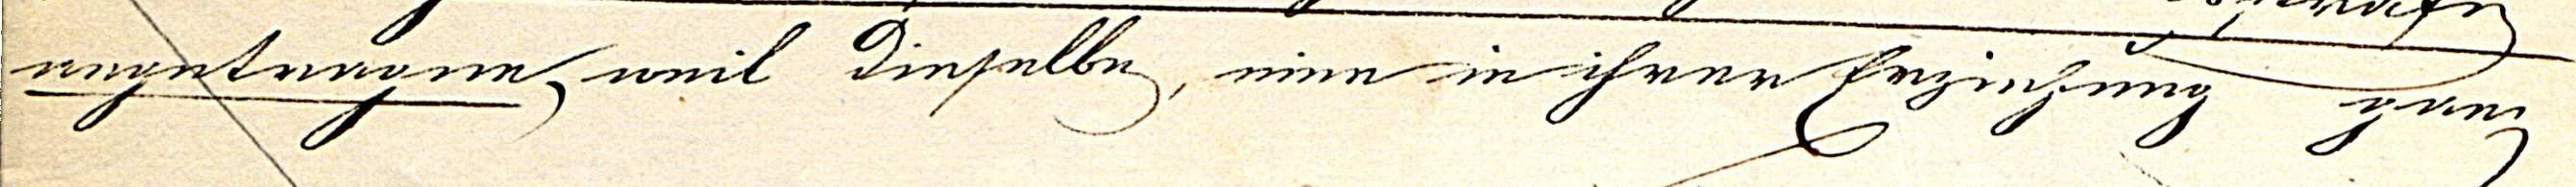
angetragen, weil dieselbe, eine in ihrer Erziehung ganz
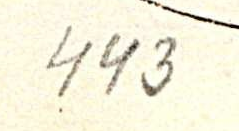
443
